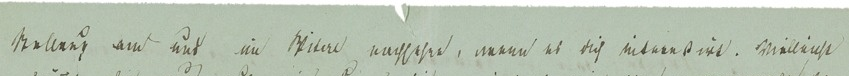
Stellung am und im Spital nachsehen, wenn es dich intereßirt. Vielleicht
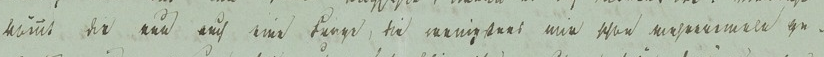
kommt dir nun auch eine Frage, die wenigstens mir schon mehreremale ge-
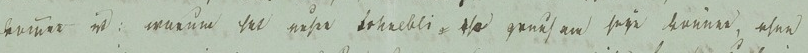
kommen ist: warum hat unser Schnebli so grausam seyn können, ohne
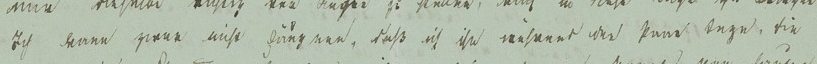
Ich kann zwar nicht läugnen, daß ich ihn während der Paar Tage, die
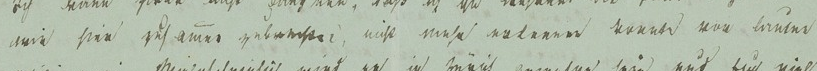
wir hier zusammen zubrachten, nicht mehr erkennen konnte vor lauter
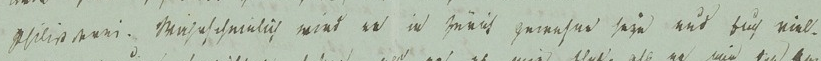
Philisterei. Wahrscheinlich wird er in Zürich gewesen seyn und Euch viel-
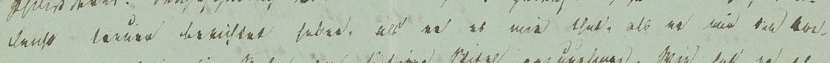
leicht treuer berichtet haben, als er es mir that, als er mir den Vor-
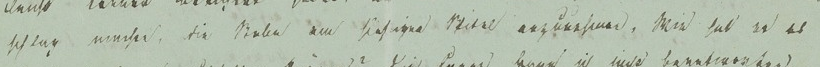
schlag machte, die Stelle am hiesigen Spital anzunehmen. Wie hat er es
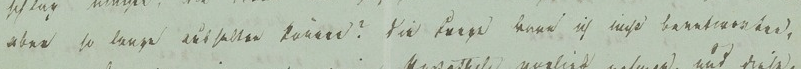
aber so lange aushalten können? Die Frage kann ich nicht beantworten,
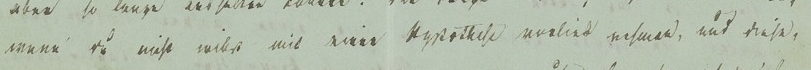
wenn du nicht willst mit einer Hypothese vorlieb nehmen, und diese,
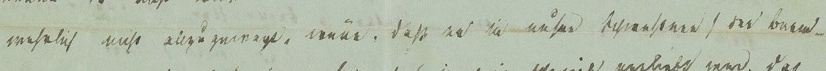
wahrlich nicht allzu gewagt wäre, daß er in unsre Schwestern (der Barm-
